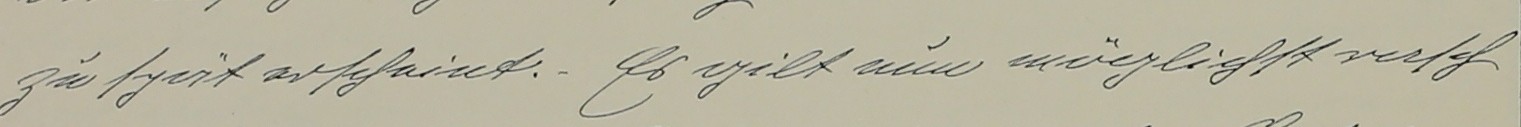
zu spät erscheint. - Es gilt nun möglichst rasch
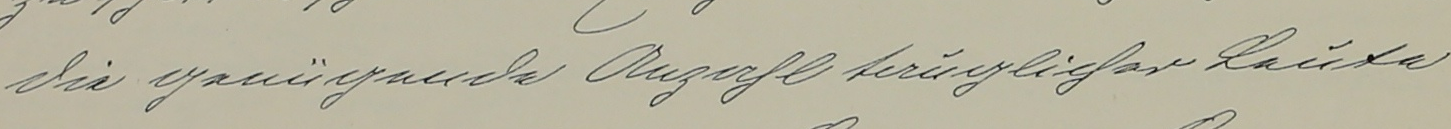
die genügende Anzahl tauglicher Leute
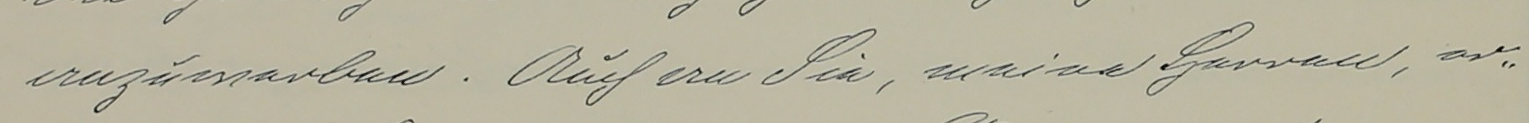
anzuwerben. Auch an Sie, meine Herren, er-
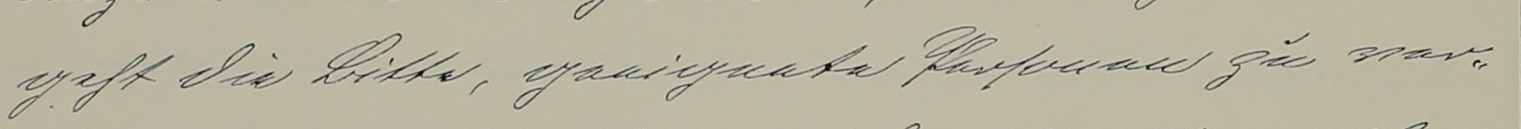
geht die Bitte, geeignete Personen zu ver-
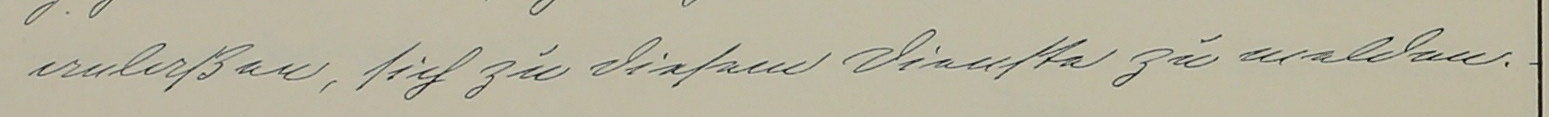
anlaßen, sich zu diesem Dienste zu melden.
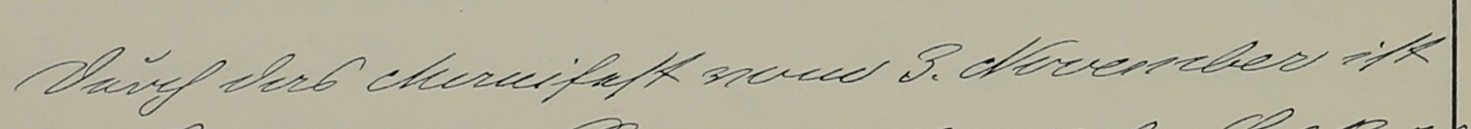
Durch das Manifest vom 3. November ist
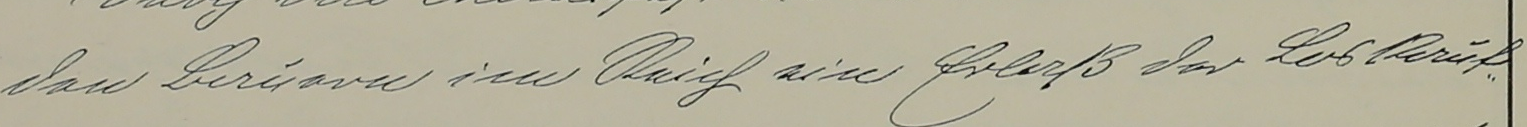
den Bauern im Reich ein Erlaß der Loskauf-
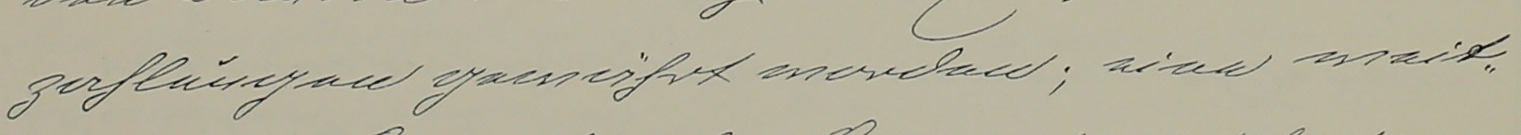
zahlungen gewährt worden; eine weit-
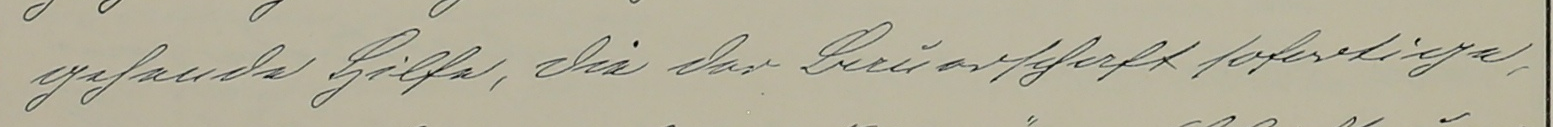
gehende Hilfe, die der Bauerschaft sofortige,
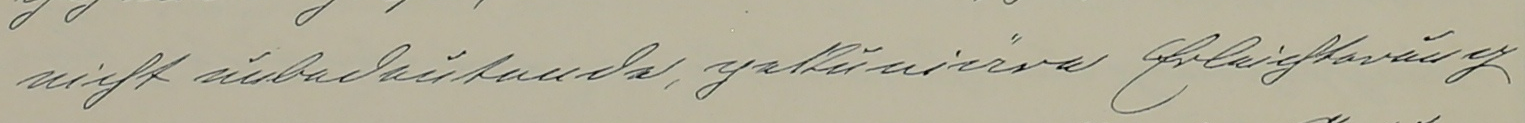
nicht unbedeutende, pekuniäre Erleichterung
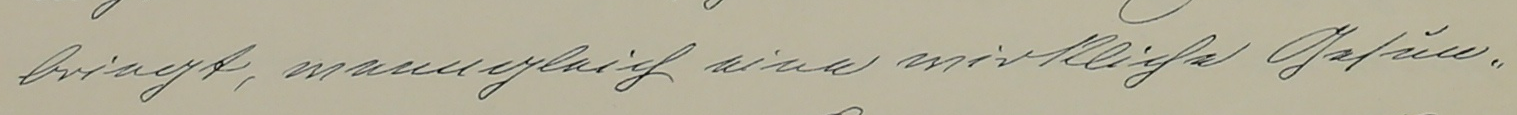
bringt, wenngleich eine wirkliche Gesun-
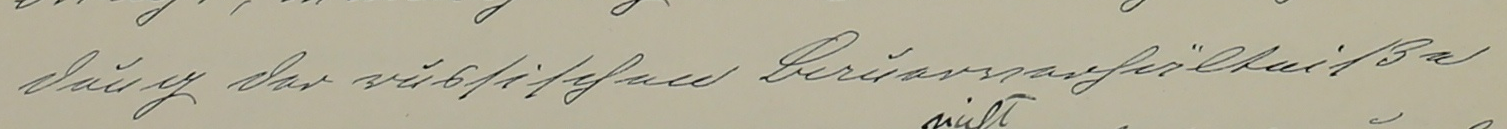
dung der russischen Bauerverhältniße
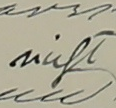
nicht
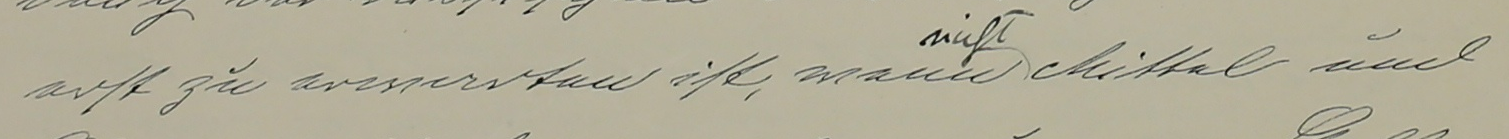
erst zu erwarten ist, wenn Mittel und
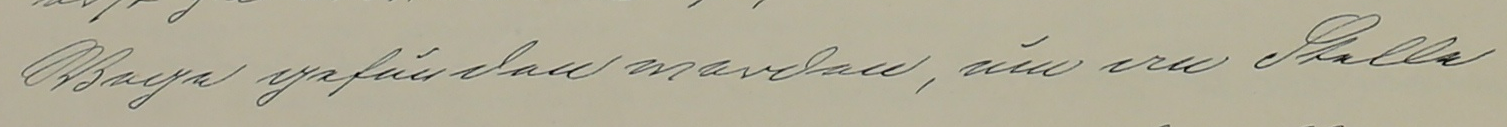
Wege gefunden werden, um an Stelle
